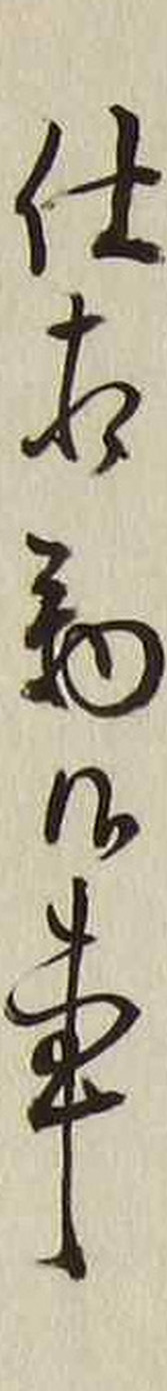仕相勤候事
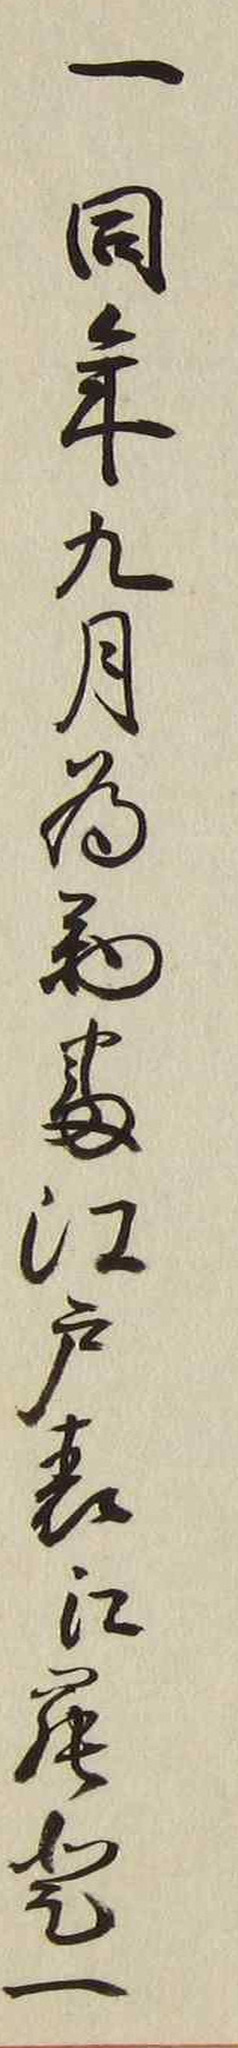一同年九月為勤番江戸表江罷登一

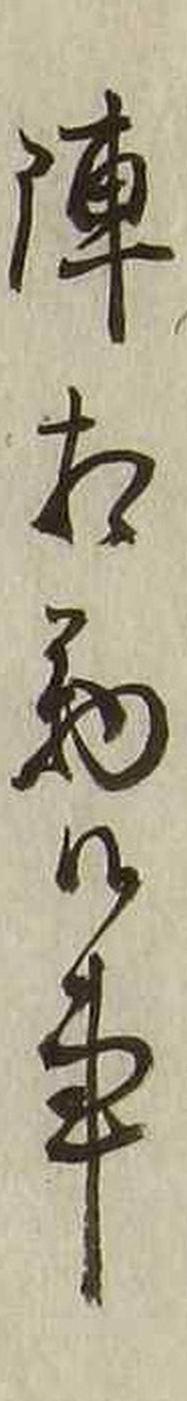陣相勤候事
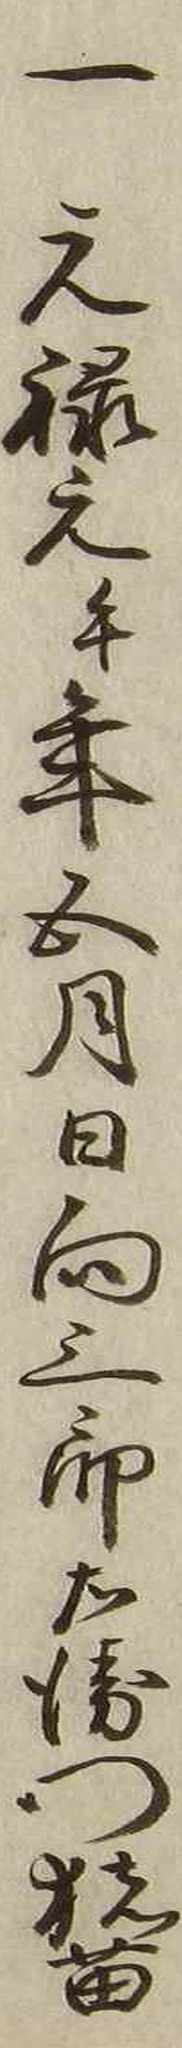一元禄元午年五月日向三郎右衛門猪苗
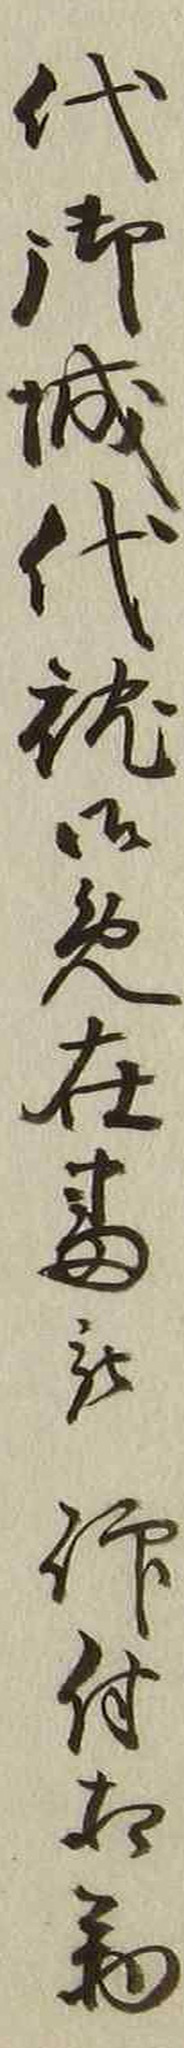代御城代就御免在番被仰付相勤
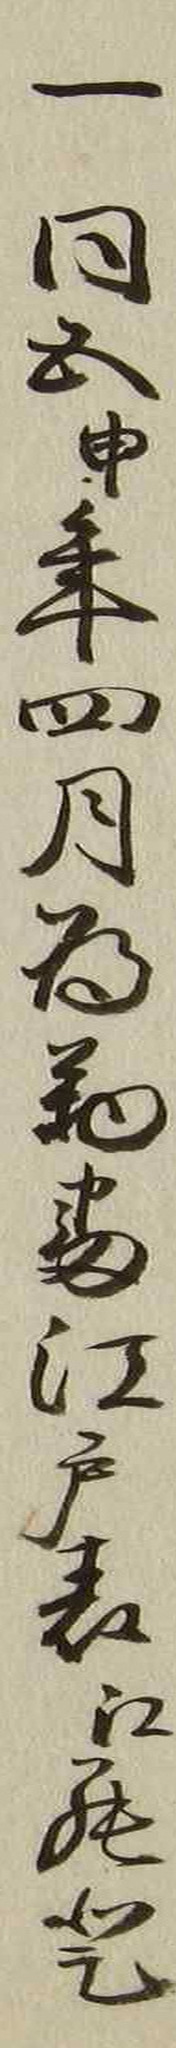一同五申年四月為勤番江戸表江罷登
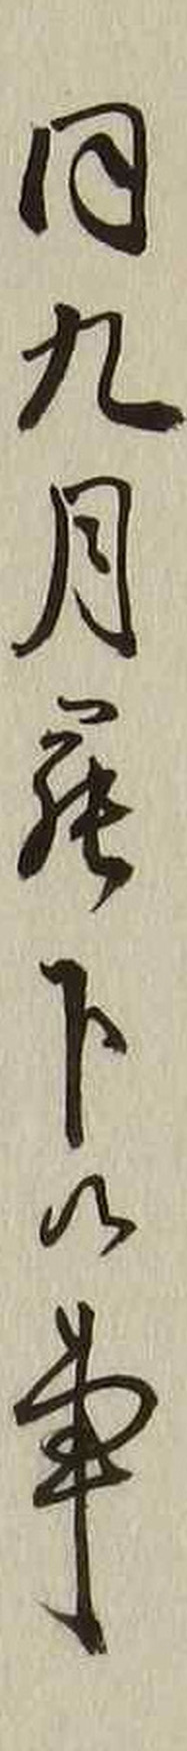同九月罷下候事
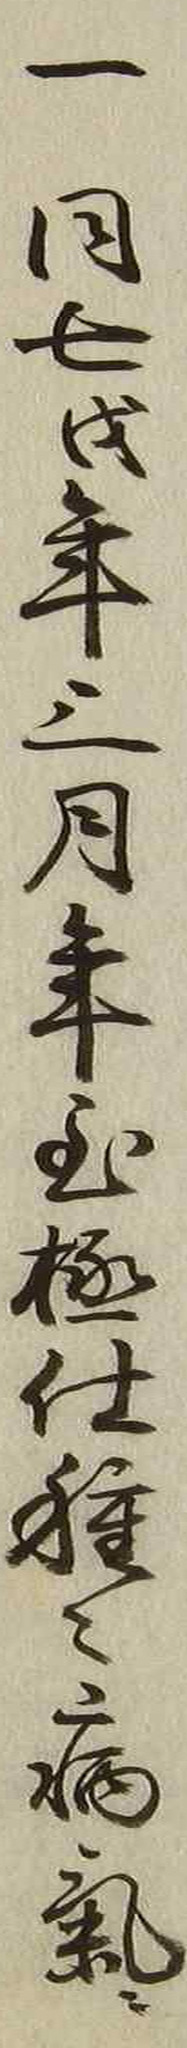一同七戌年三月年至極仕種々病気ニ
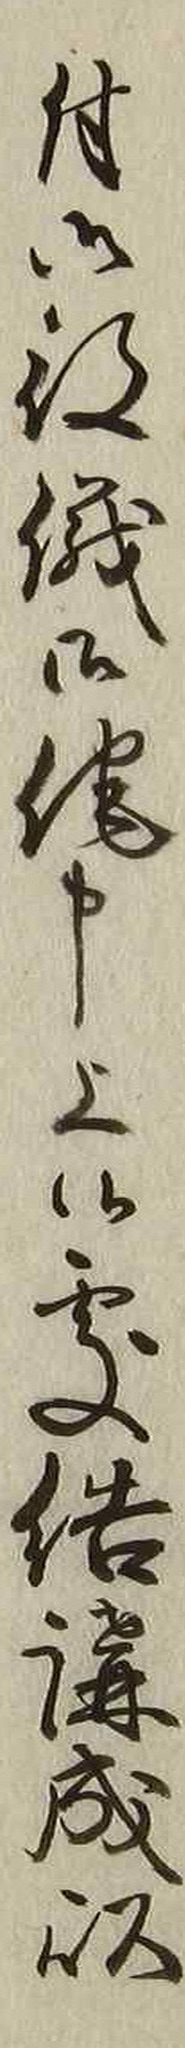付御役儀御侘申上候処結講成以
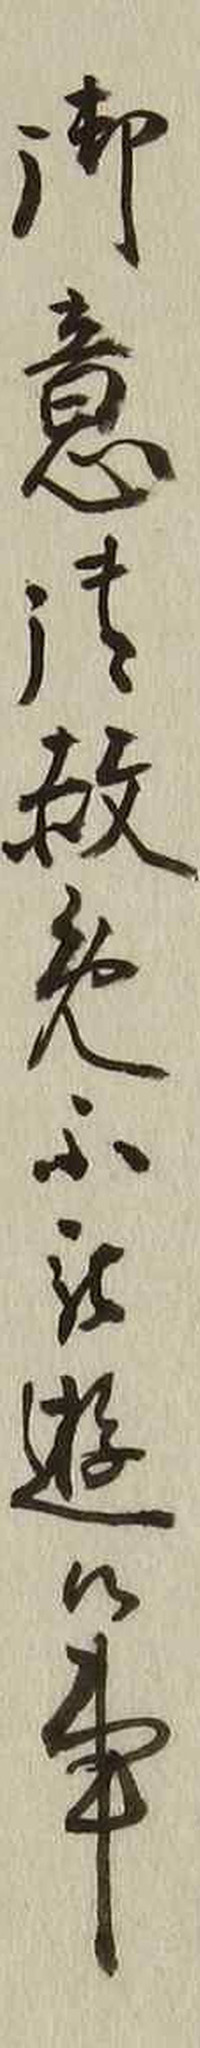御意御赦免不被遊候事
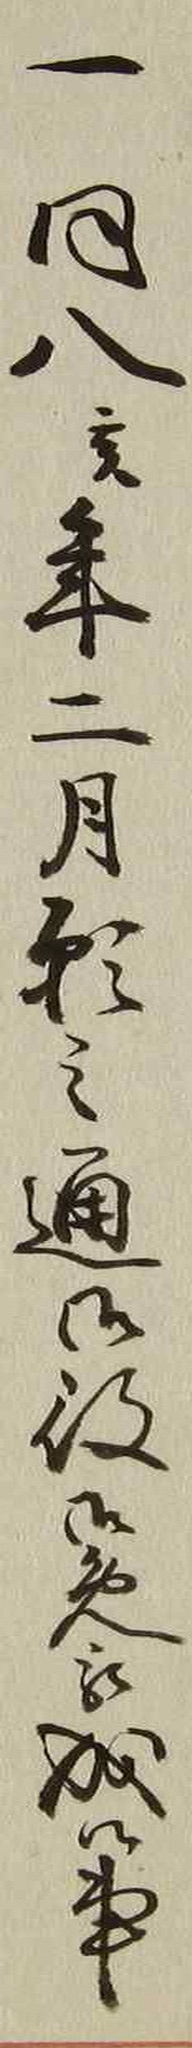一同八亥年二月願之通御役御免被成候事
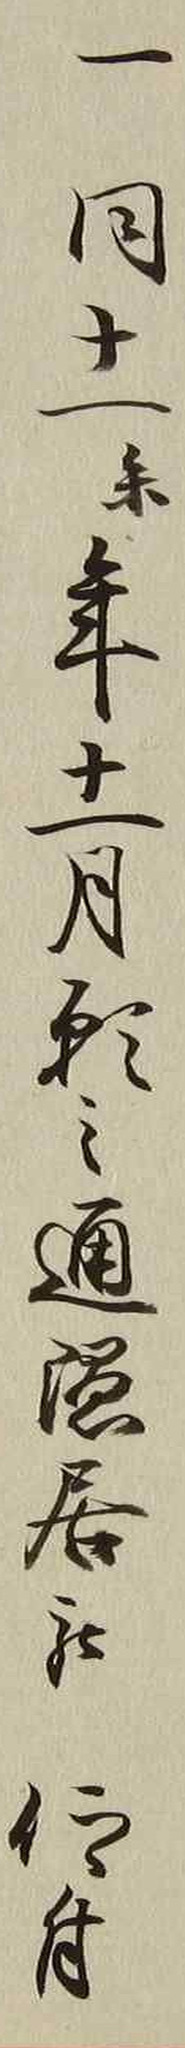一同十一未年十一月願之通隠居被仰付
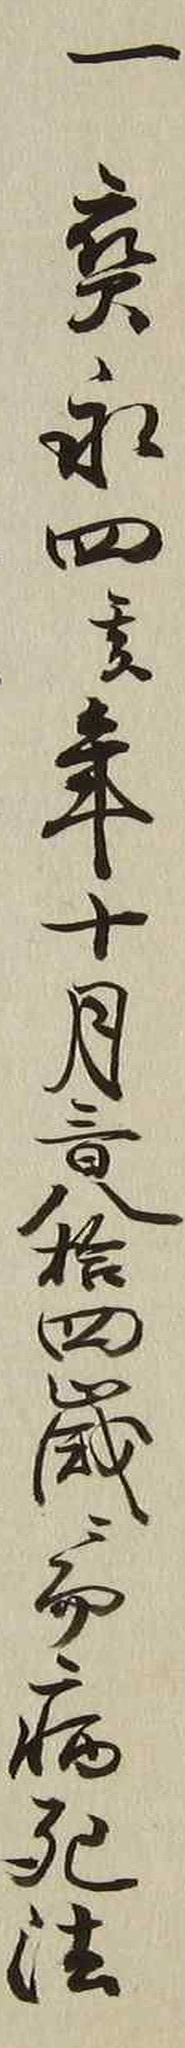一宝永四亥年十月三日八拾四歳ニ而病死法
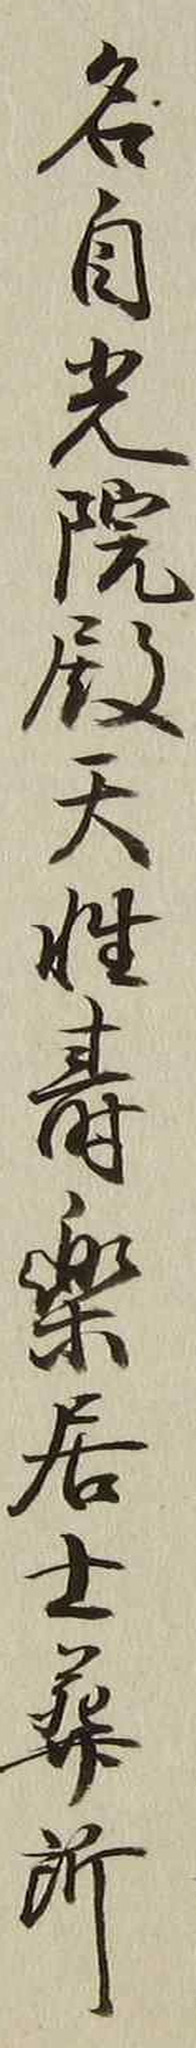名自光院殿天性寿楽居士葬所
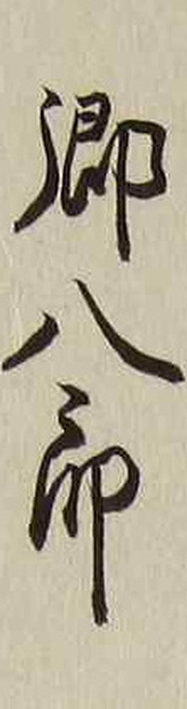郷八郎
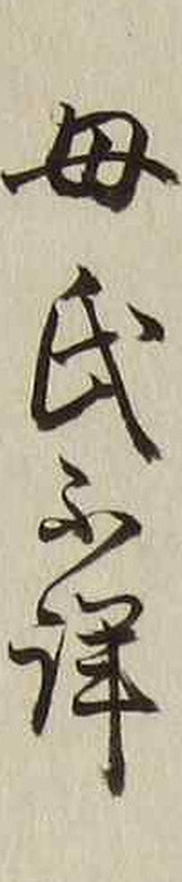母氏不詳
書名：諸士系譜　巻之15　い之部15
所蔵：会津若松市立会津図書館
